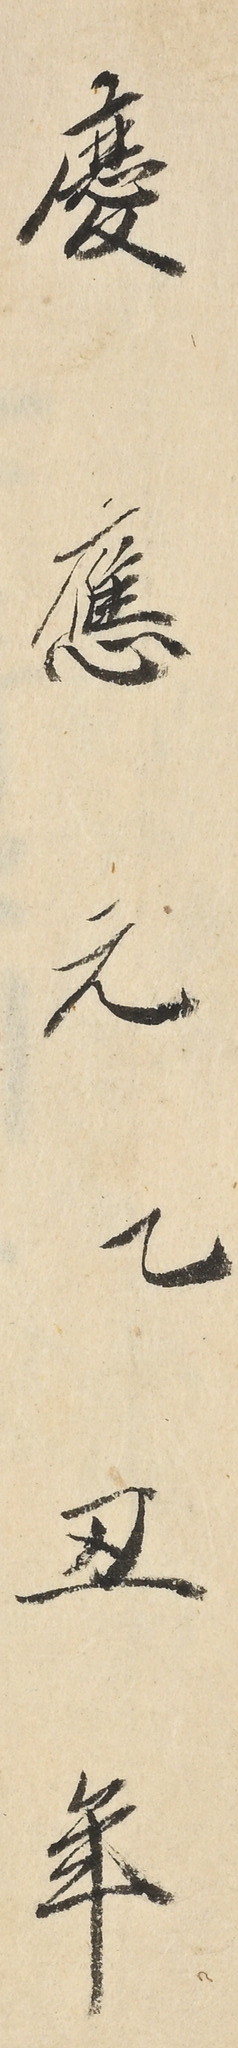慶応元乙丑年
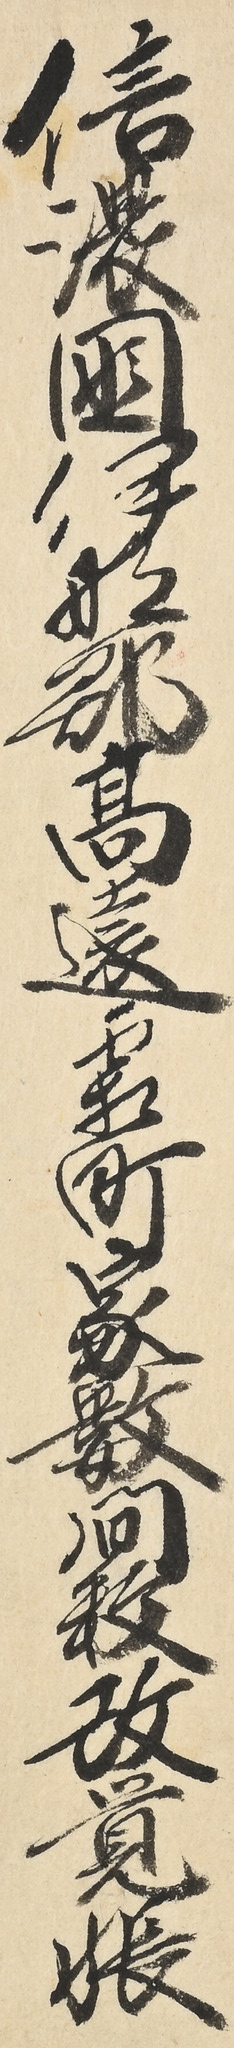信濃国伊那郡高遠霜町家数間数改覚帳
